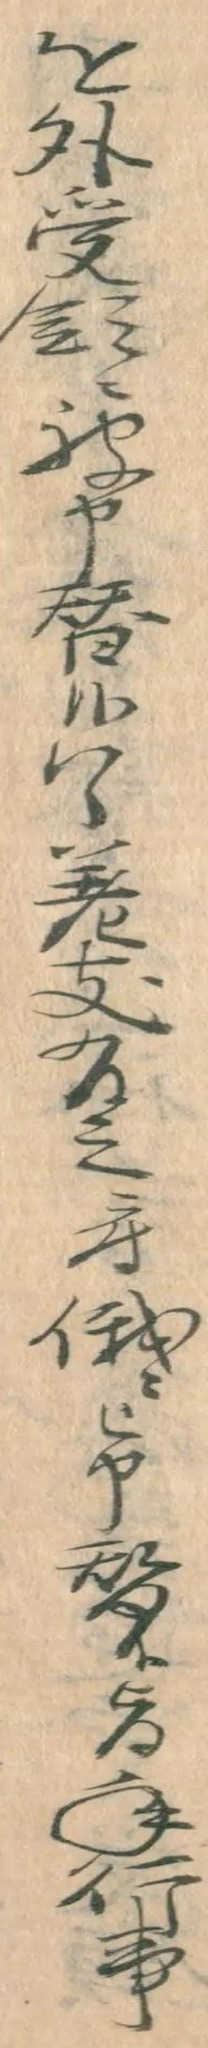を外受領に被申替候ハヽ差支有之に付俄ニ被為替候旨年行事
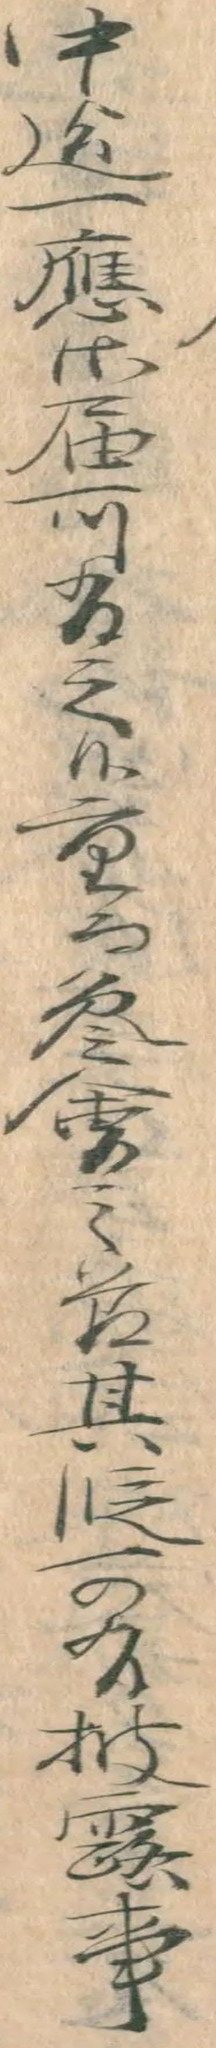中迄一應御届可有之候重而参會之節其段可有披露事
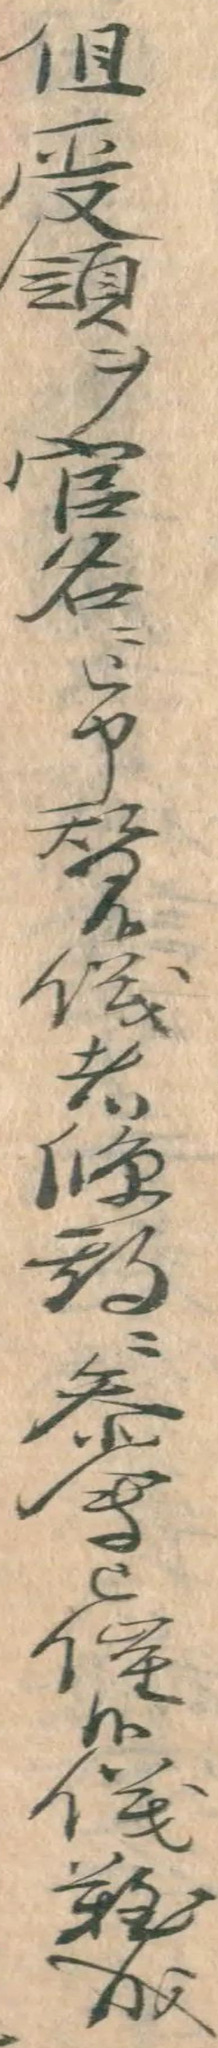但受領ヲ官名ニ被申替候儀者條期ニ参會被催候儀難成
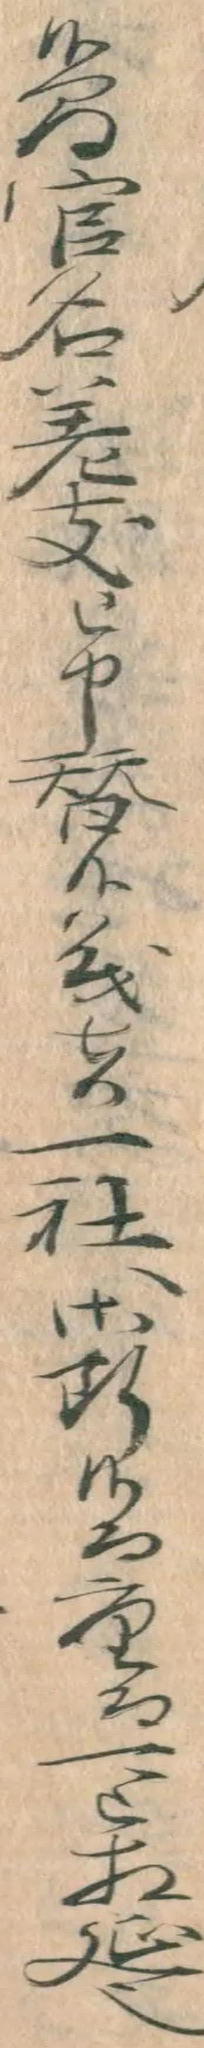候間官名差支被申替候義は一社へ御断候而重而可被相延也
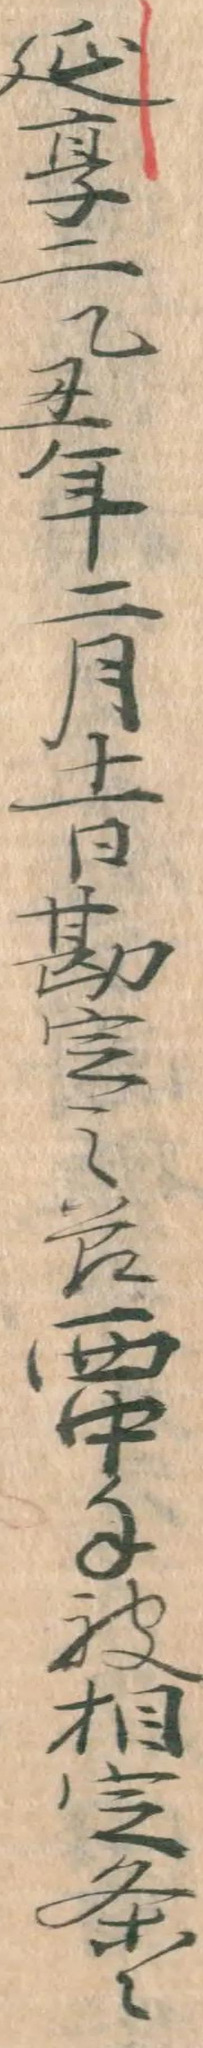延享二乙丑年二月十一日勘定之節西中手被相定条々
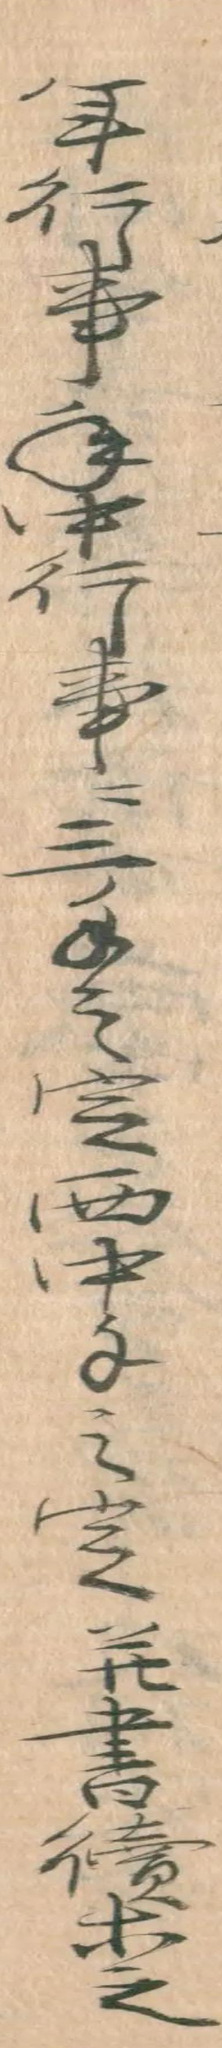一年行事年中行事ニ三手之定西中手之定并書續等之
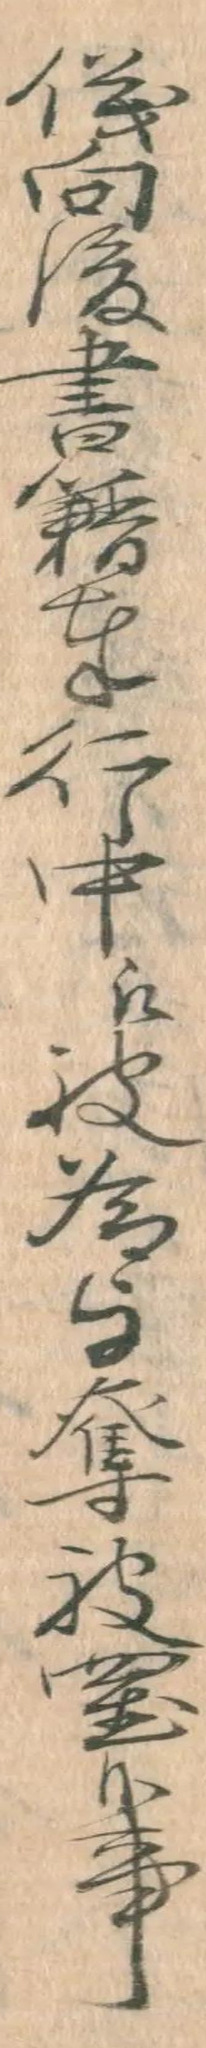儀向後書籍奉行中え被為与奪被置候事
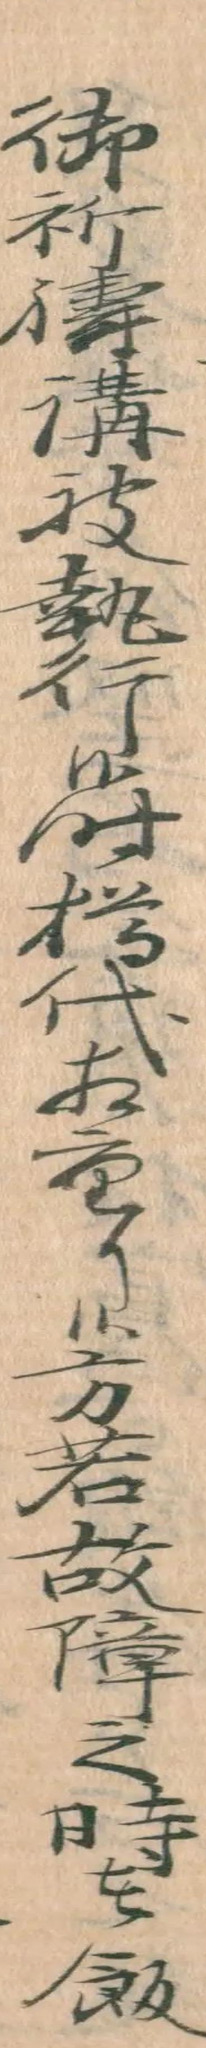一御祈祷講被執行候時樽代相重り候方若故障之時は飯
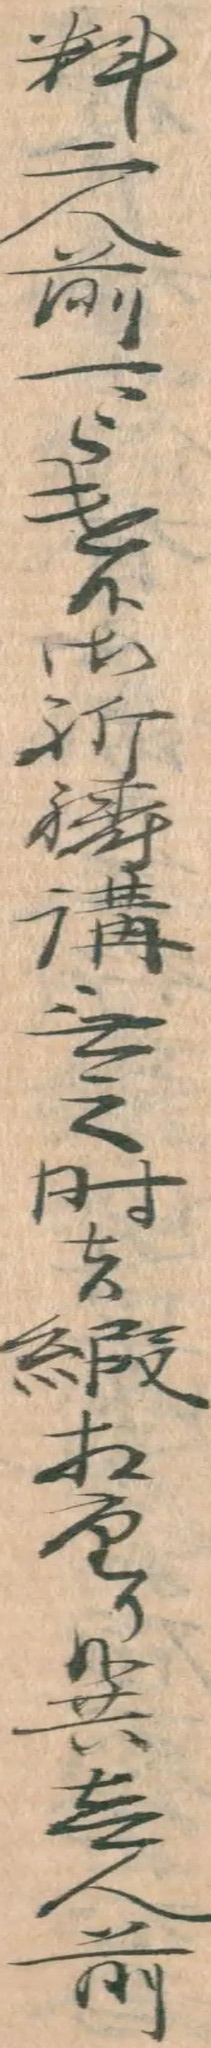料二人前可被遣候御祈祷講無之時は緞相重り候共壱人前
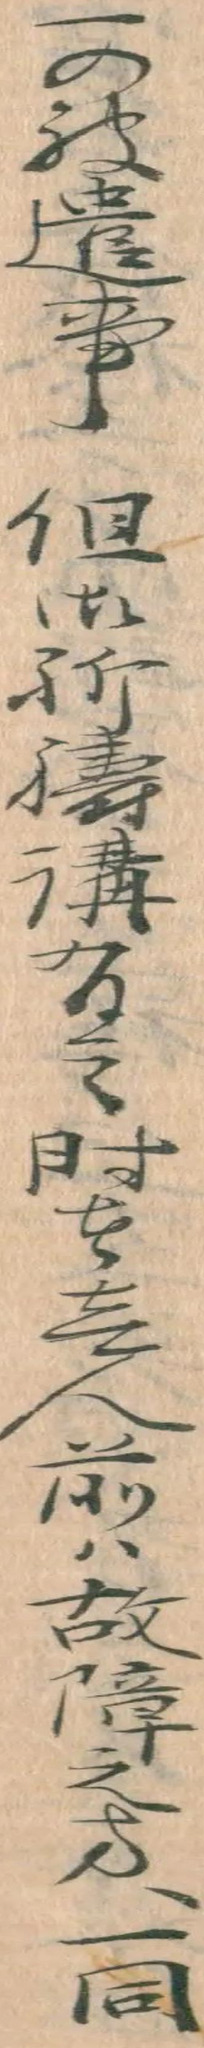可被遣事但御祈祷講有之時は壱人前ハ故障之方へ一同
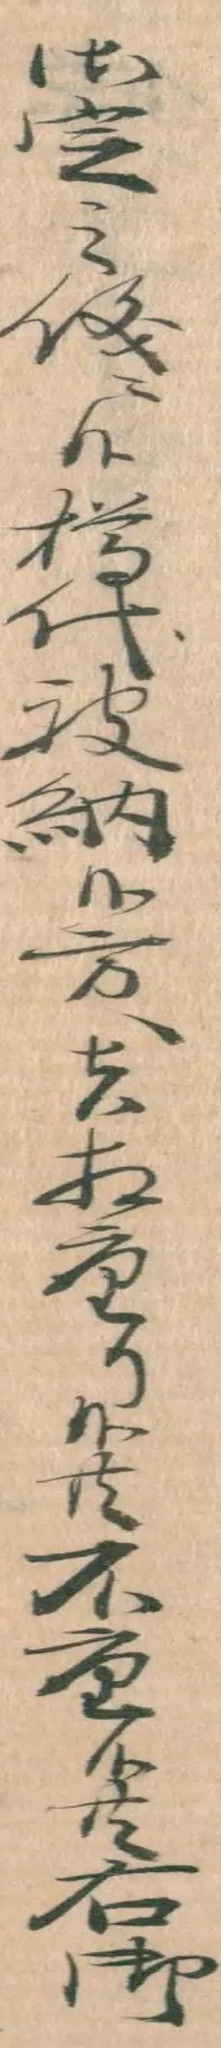御定之儀ニ候樽代被納候方へ者相重り候共不重候共右御
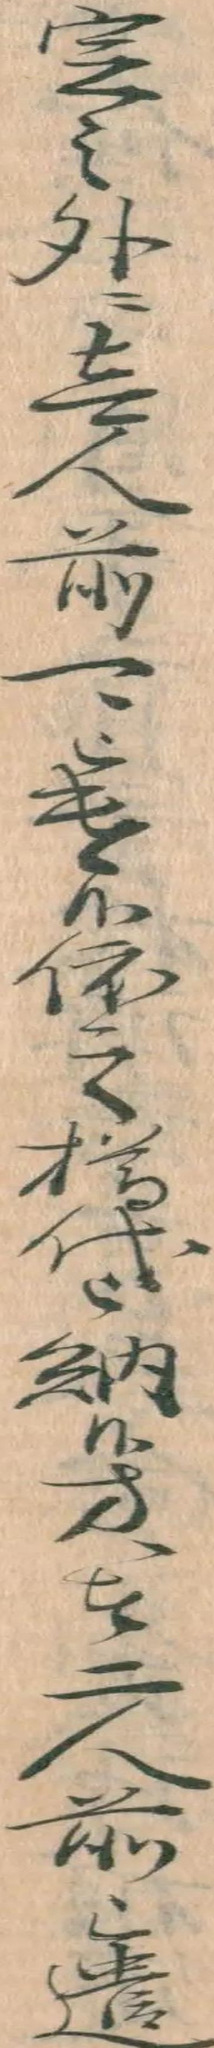定之外ニ壱人前可被遣候依之樽代被納候方へは二人前被遣
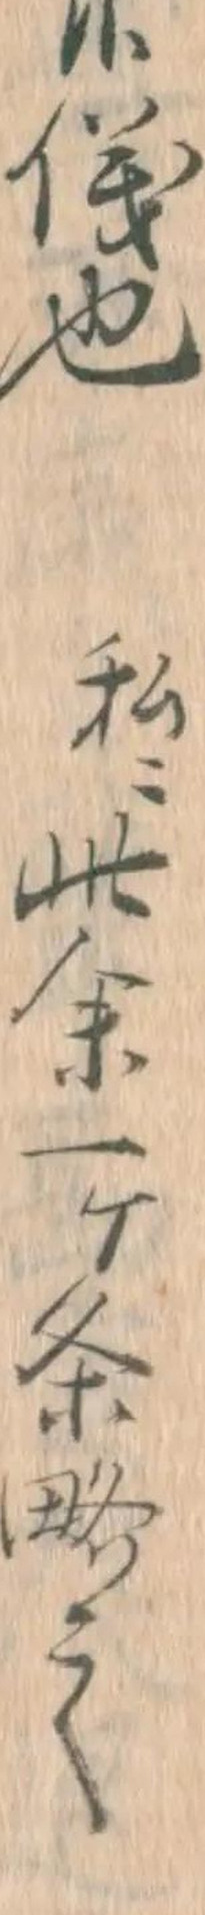候儀也私ニ此余一ヶ条略之
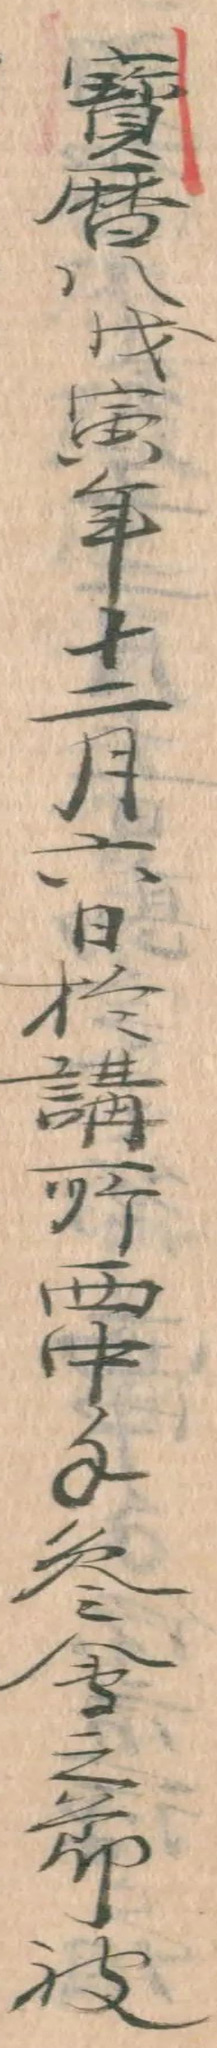寶暦八戌寅年十二月六日於講所西中手参會之節被
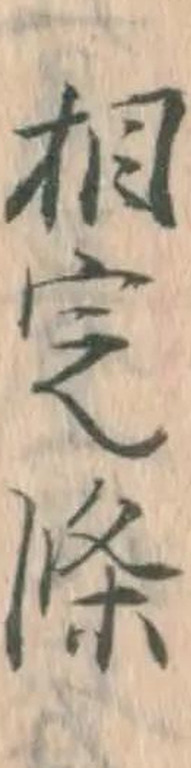相定條
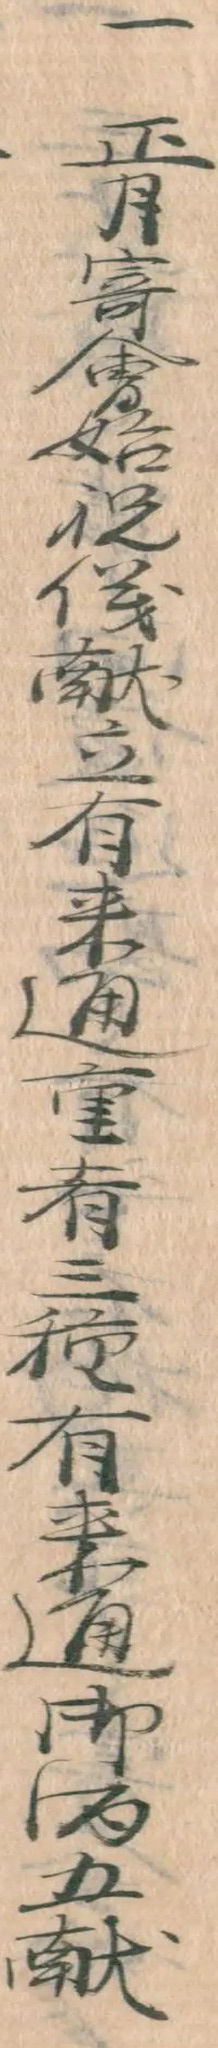一正月寄會始祝儀献立有来通重肴三種有来興御酒五献
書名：賀茂社記録. 第29冊
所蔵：国立国会図書館 National Diet Library, JAPAN
